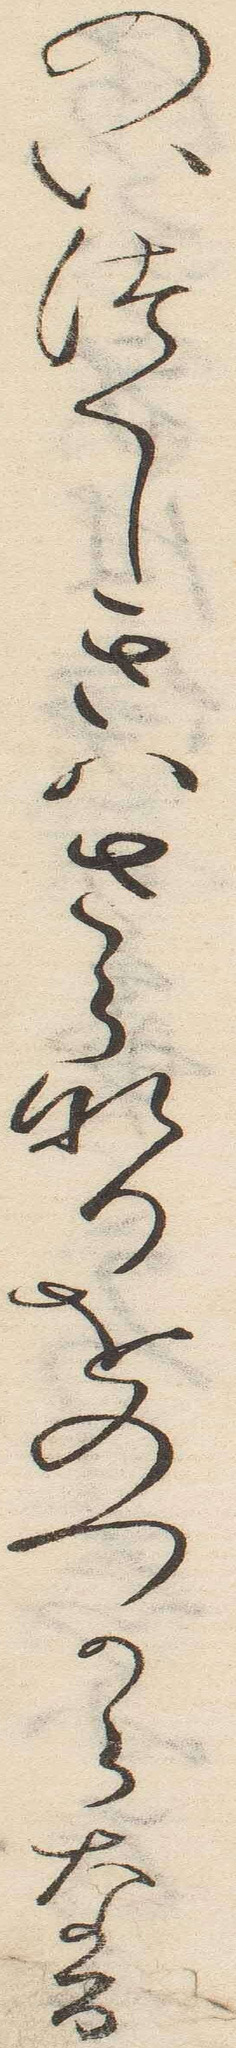のいつくしきはさらなりをのつからなる
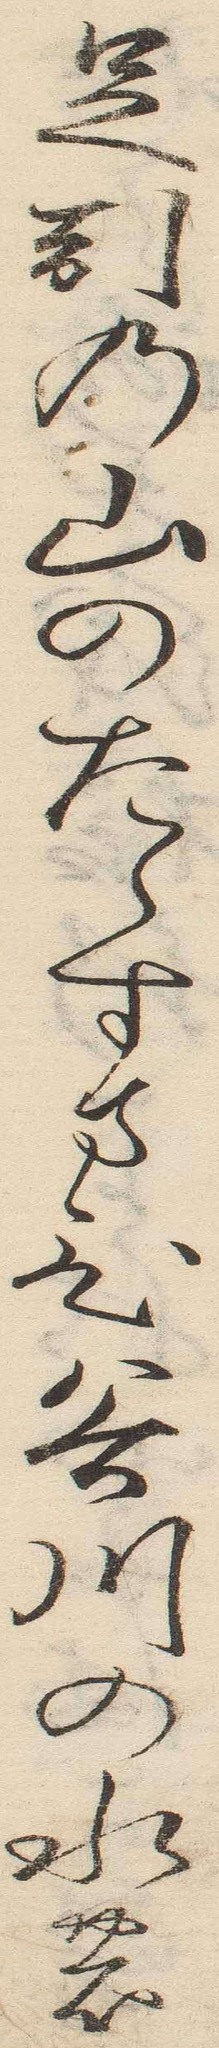足引の山のたゝすまひ谷川の水の
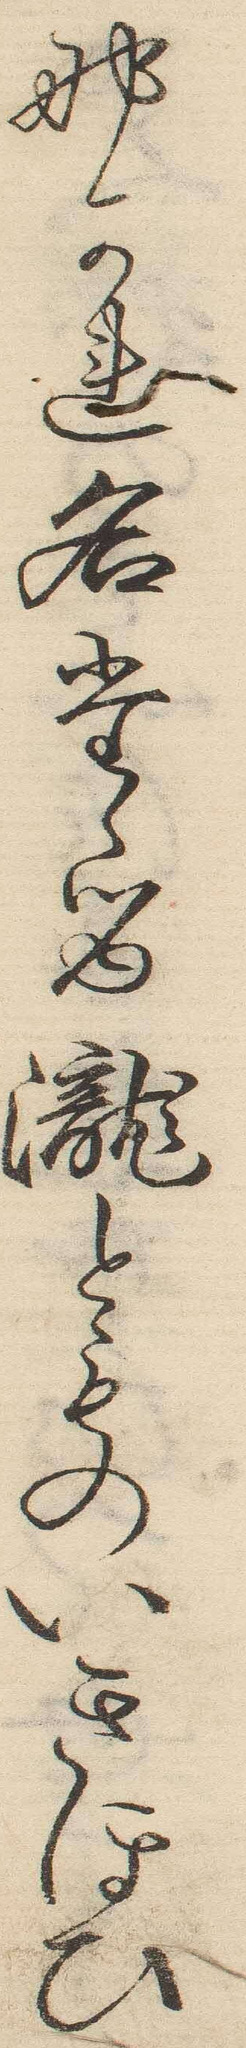なかれ名たゝる瀧とものいきほひ

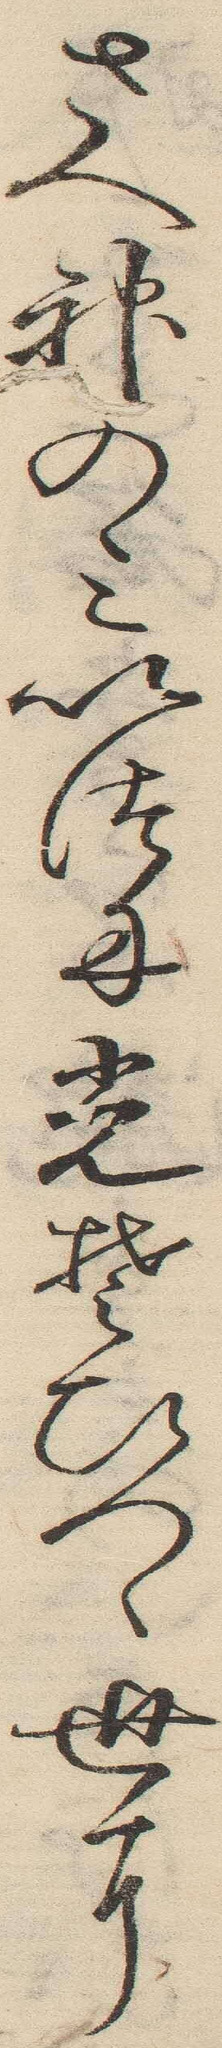さへ神のみいつに光そひつゝ世に
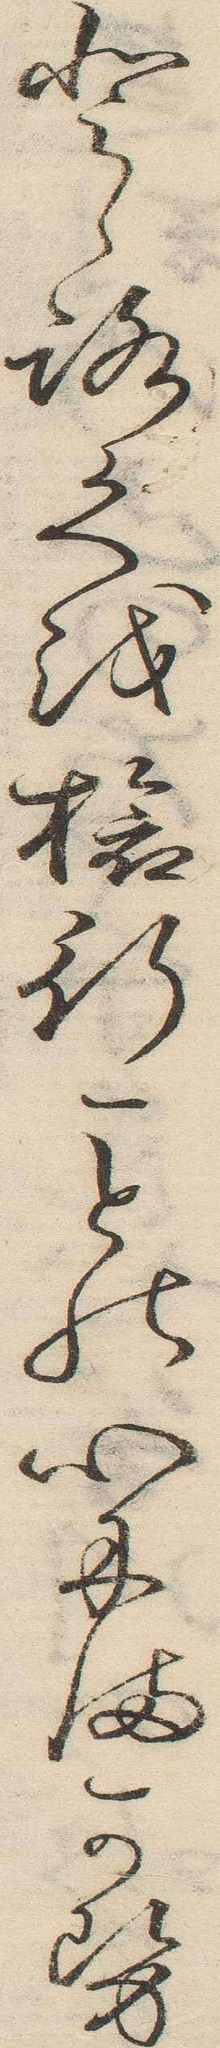とゝろくを旅行ことの心にまかせ
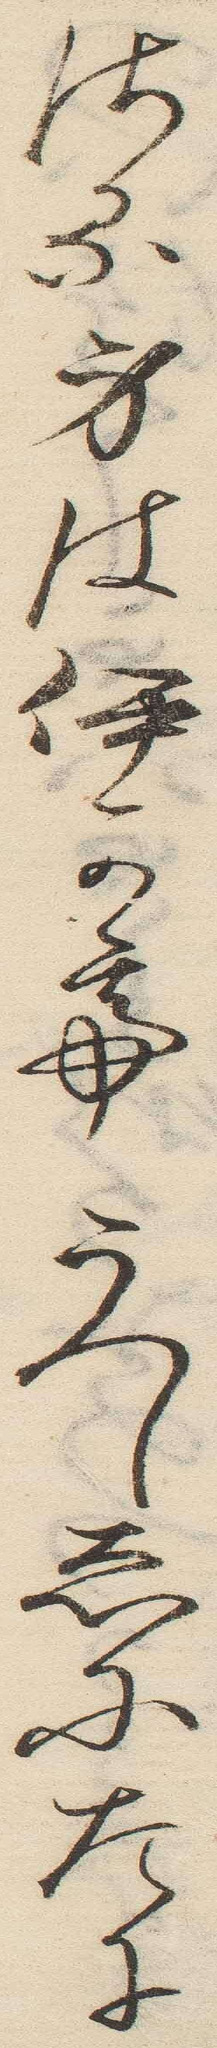さる身はいかてうつしゑにたに
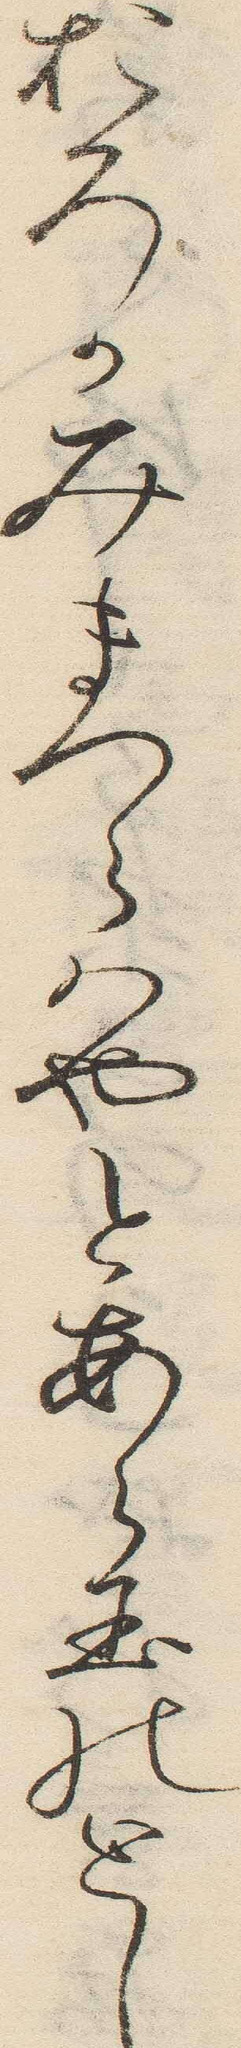おろかみまつらはやとあら玉のとし
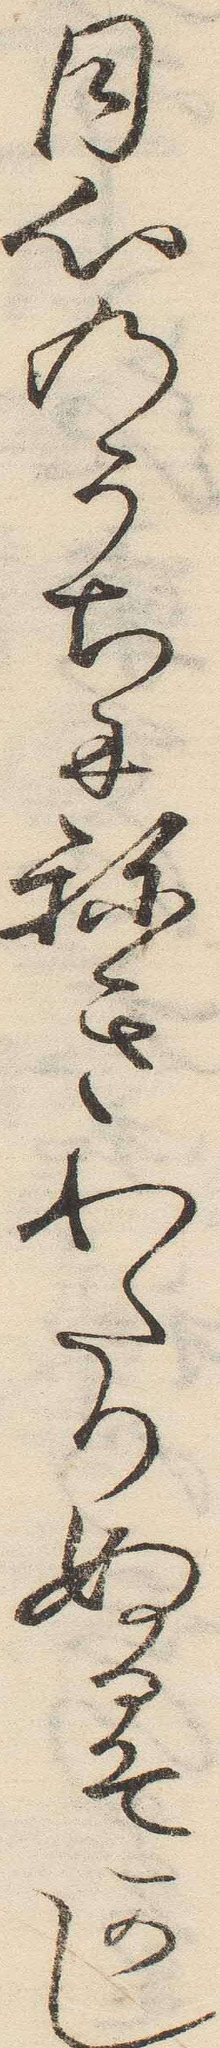月心のうちにねきわたりぬるそかし
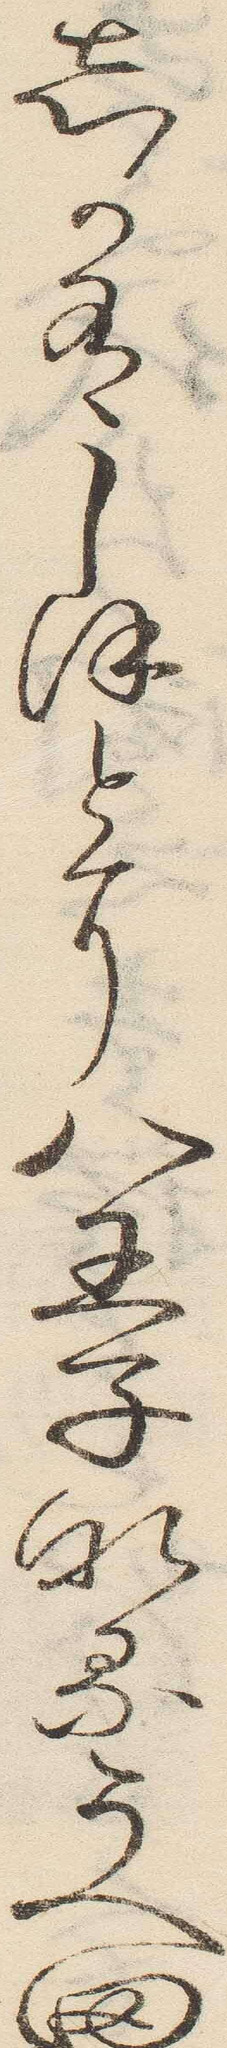しか有しほとに八王子なるうへ田
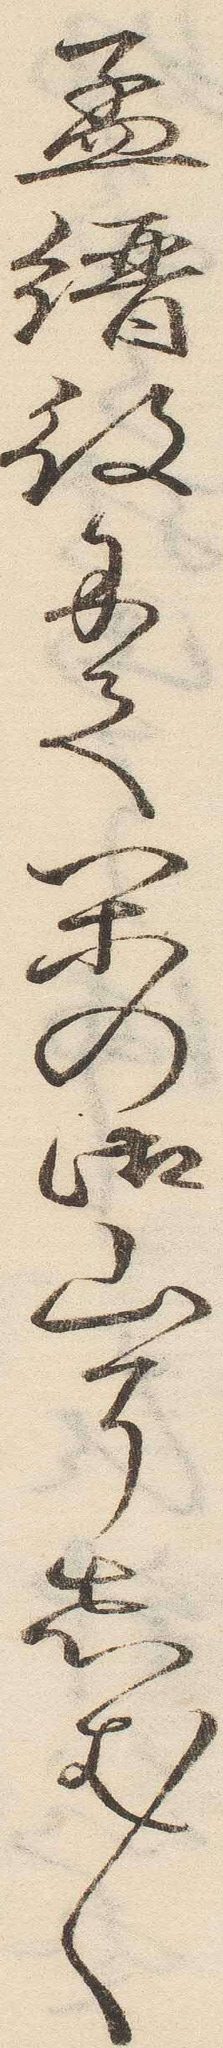孟縉役にてかの御山にしは〳〵
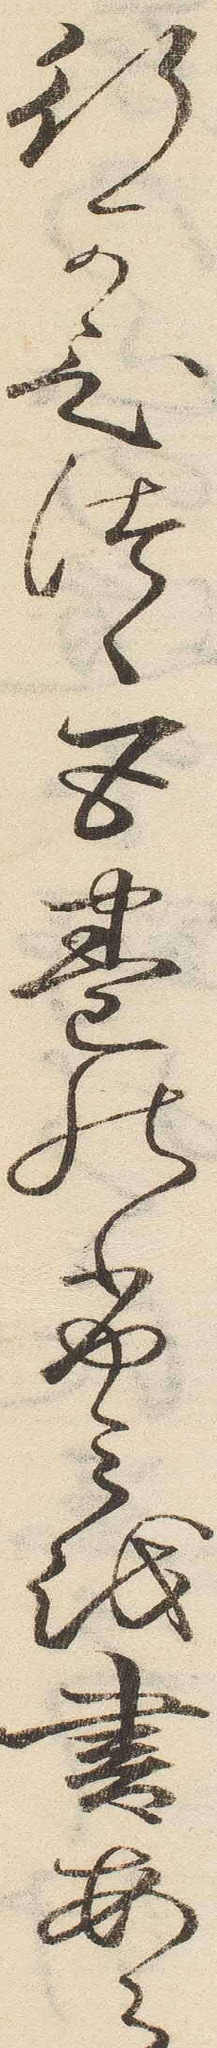行かひつゝ五巻のふみを書あら
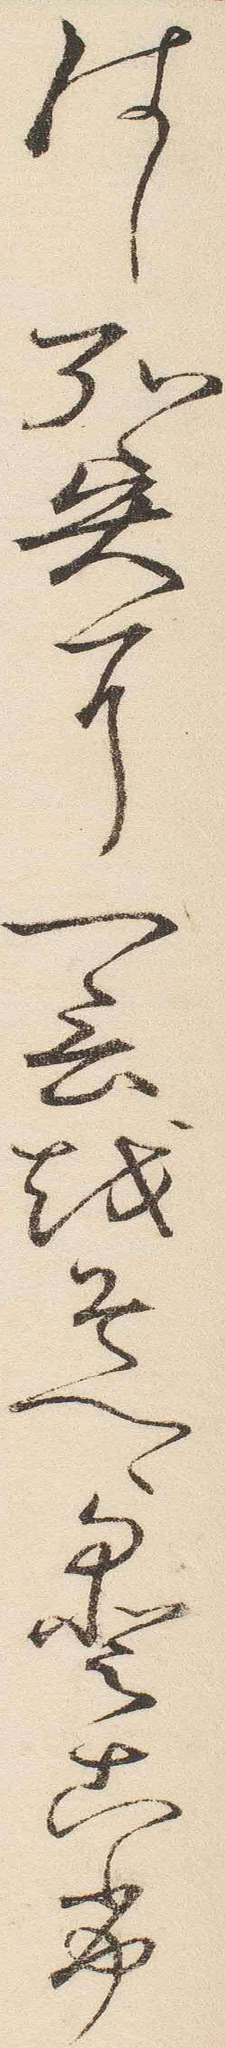はし弘賢に一言をそへよとこふ
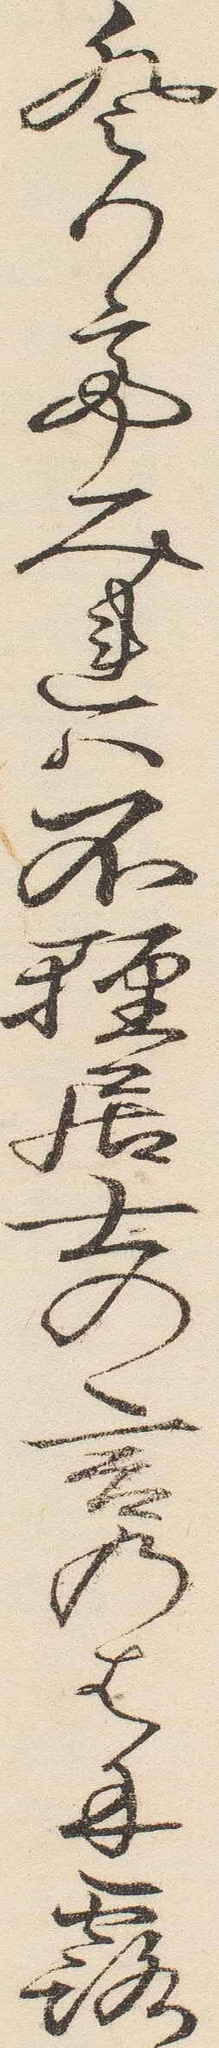とりてみれは不軽居士の言のはに露
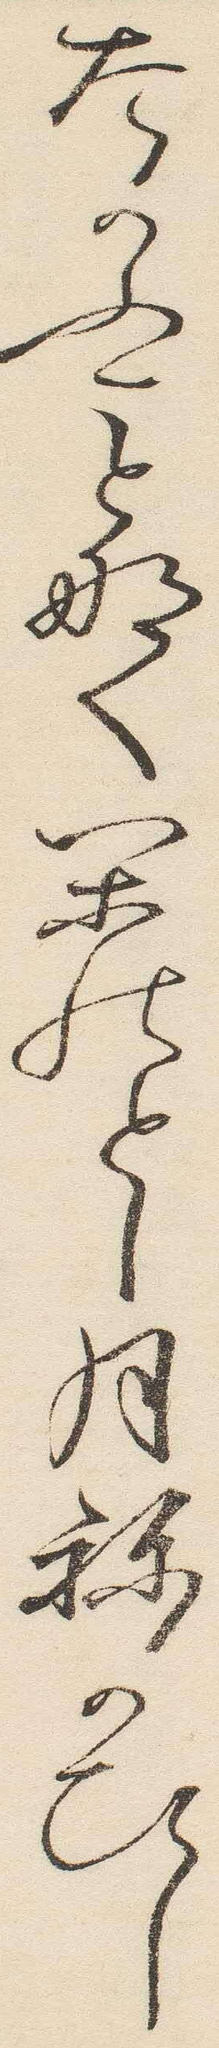たかふことなくかのとし月ねかひし
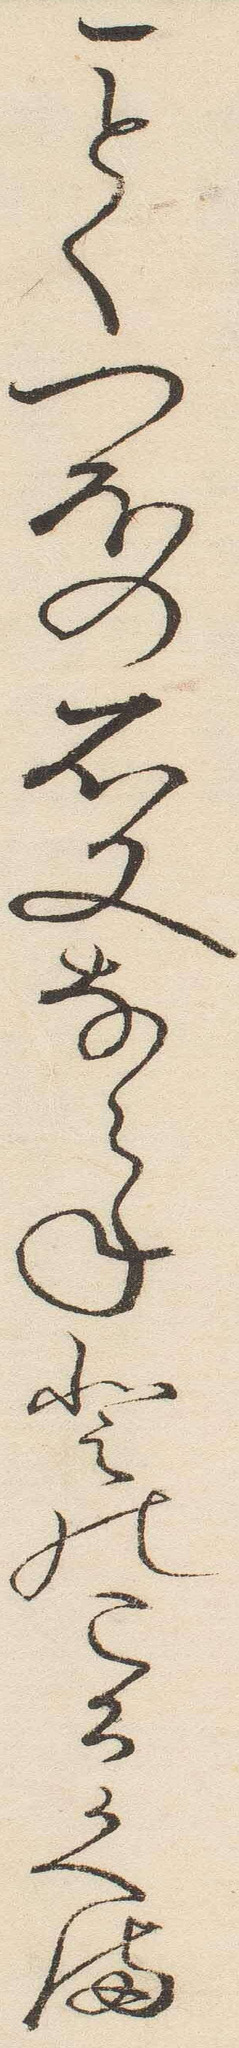ことくつほの石文ならねとのこるくま
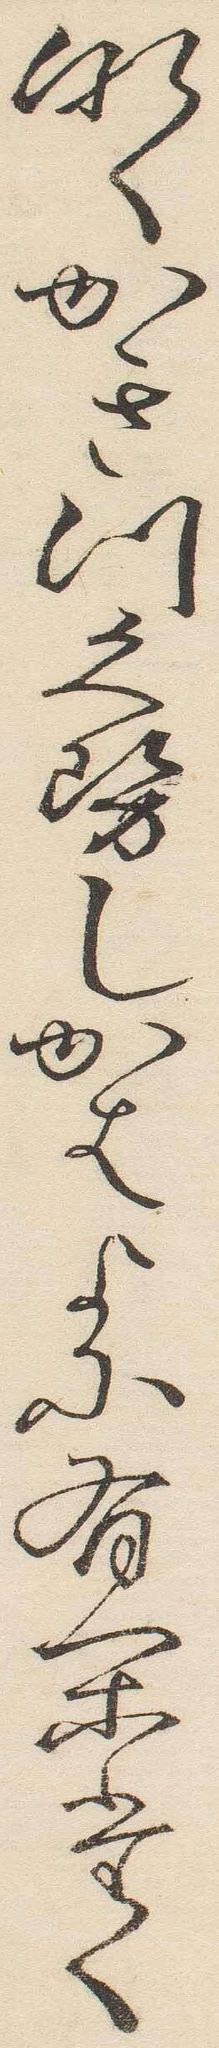なくかきつくせしかはよに有かたく
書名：日光山志
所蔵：東京学芸大学附属図書館 国文学研究資料館
